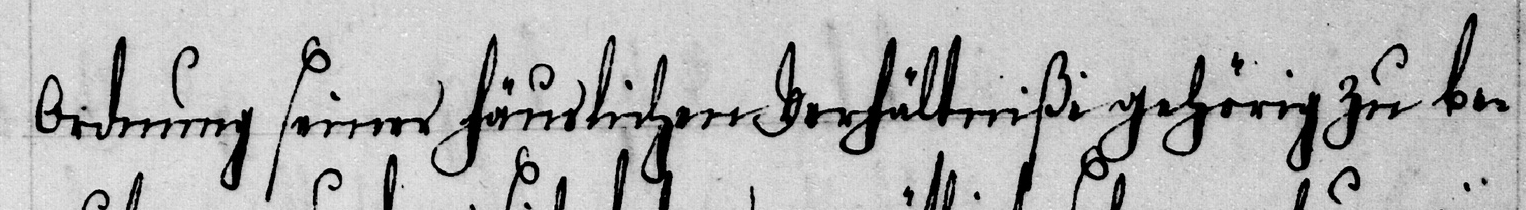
Ordnung seiner häuslichen Verhältniße gehörig zu be¬
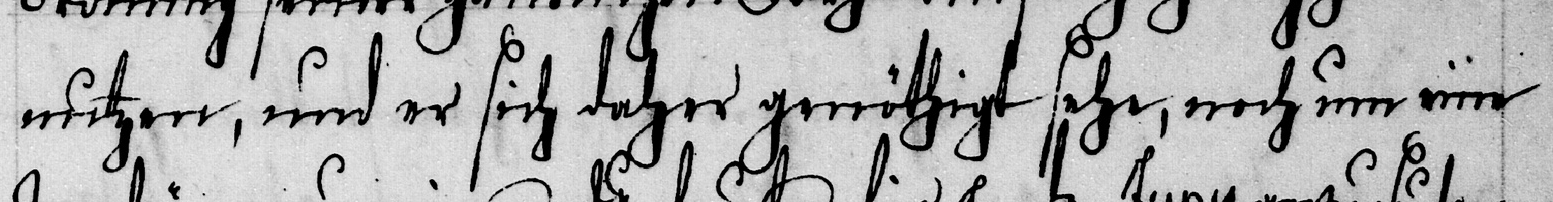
nutzen, und er sich daher genöthigt sehe, noch um eine
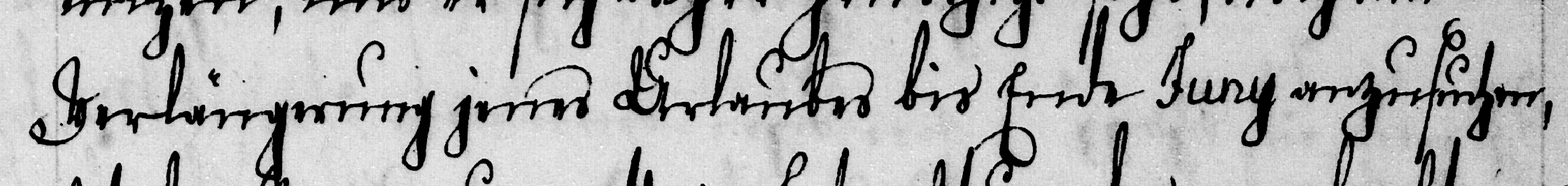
Verlängerung jenes Urlaubes bis Ende Juny anzusuchen,
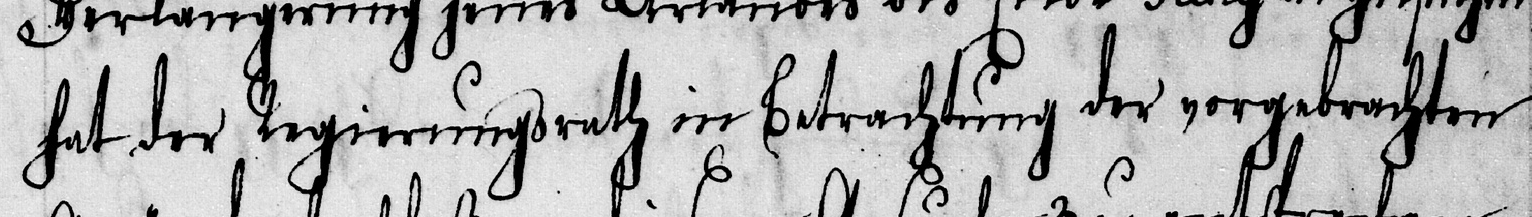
hat der Regierungsrath in Betrachtung der vorgebrachten
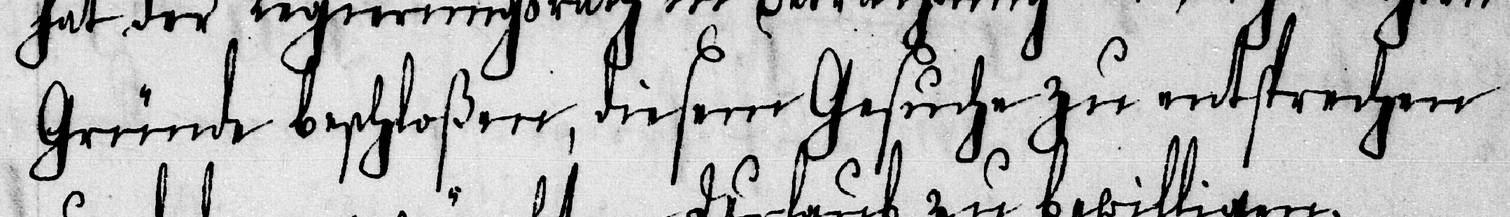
Gründe beschloßen, diesem Gesuche zu entsprechen
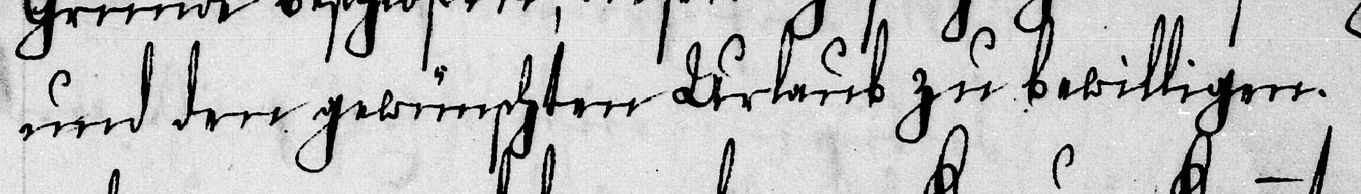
und den gewünschten Urlaub zu bewilligen.
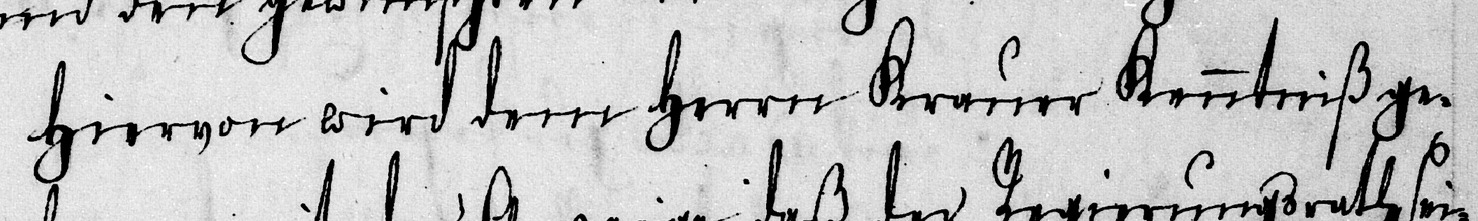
Hiervon wird dem Herrn Krauer Kenntniß ge¬
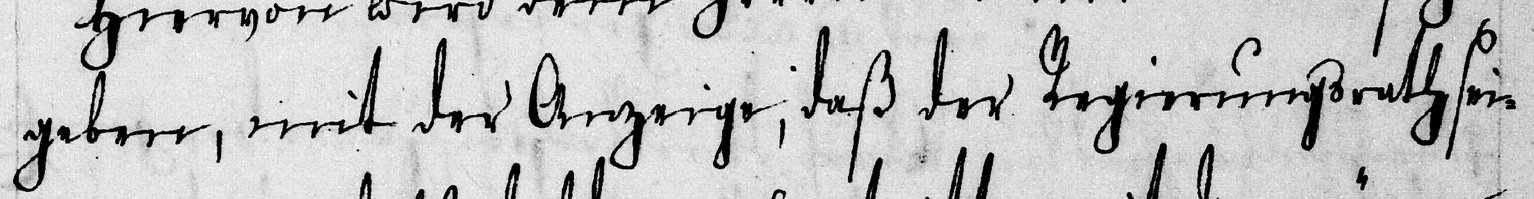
geben, mit der Anzeige, daß der Regierungsrath sei¬
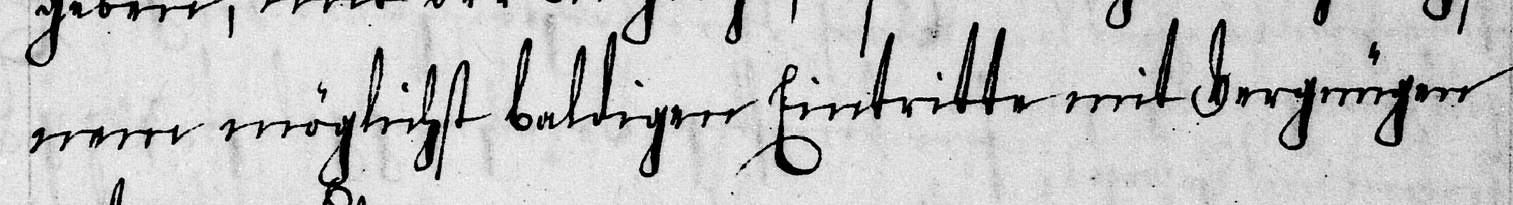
nem möglichst baldigen Eintritte mit Vergnügen
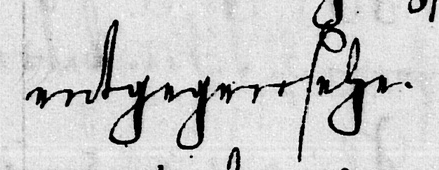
entgegensehe.
